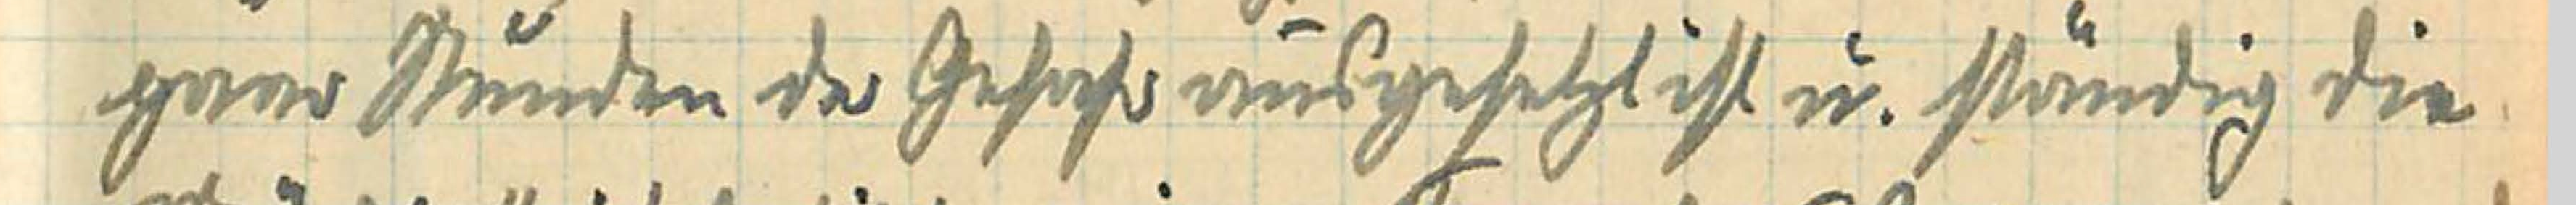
paar Stunden der Gefahr ausgesetzt ist u. ständig die
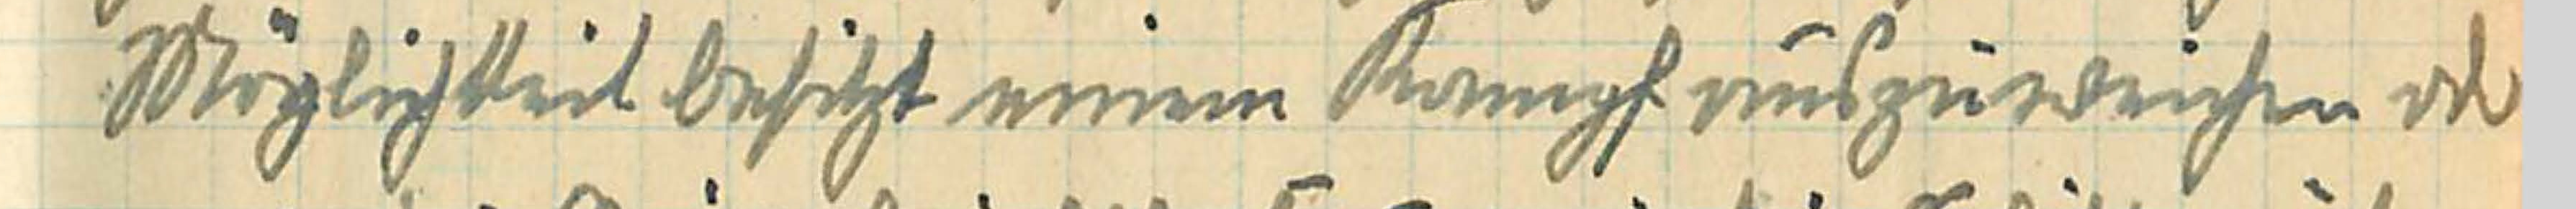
Möglichkeit besitzt einem Kampf auszuweichen oder
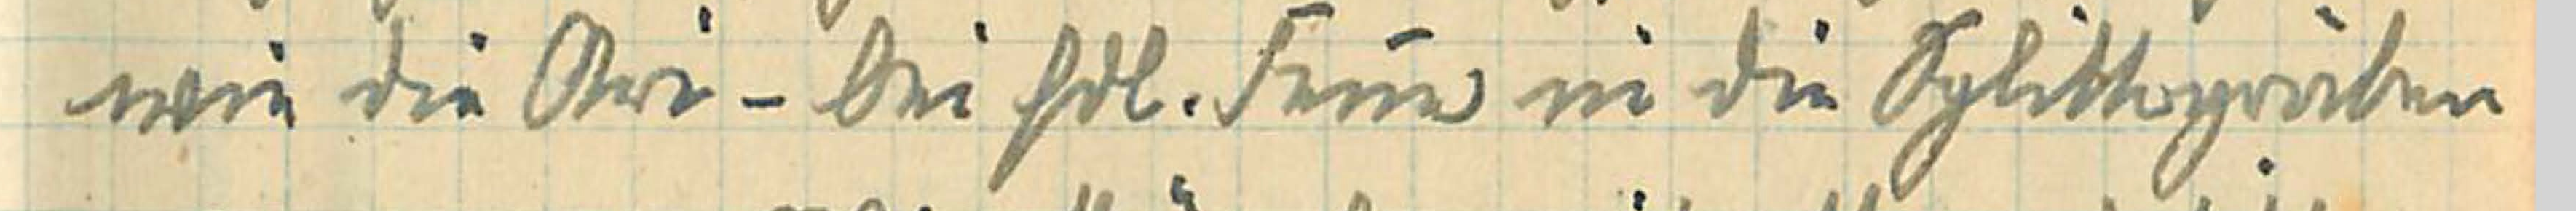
wie die Ari – bei fdl. Feuer in die Splittergräben
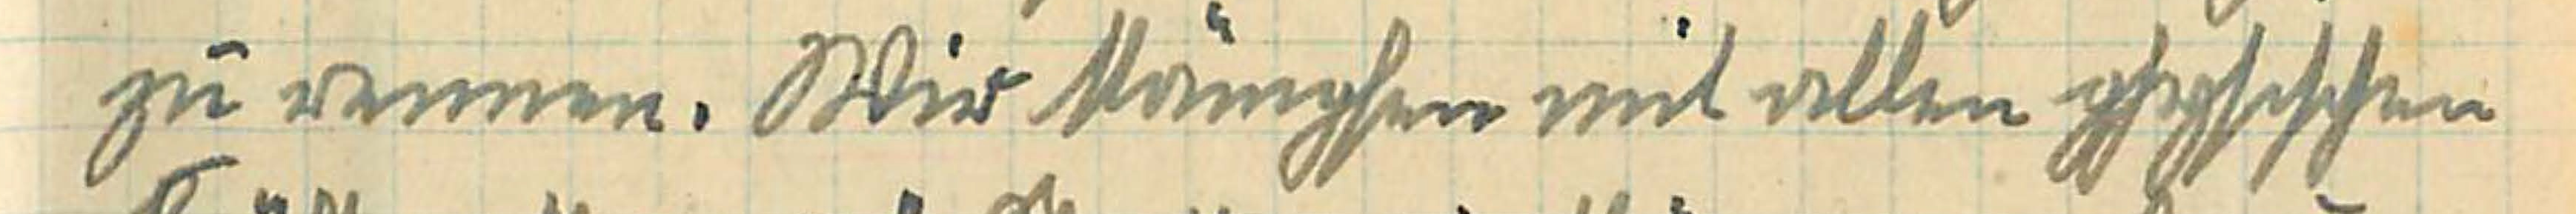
zu rennen. Wir kämpfen mit allen physischen
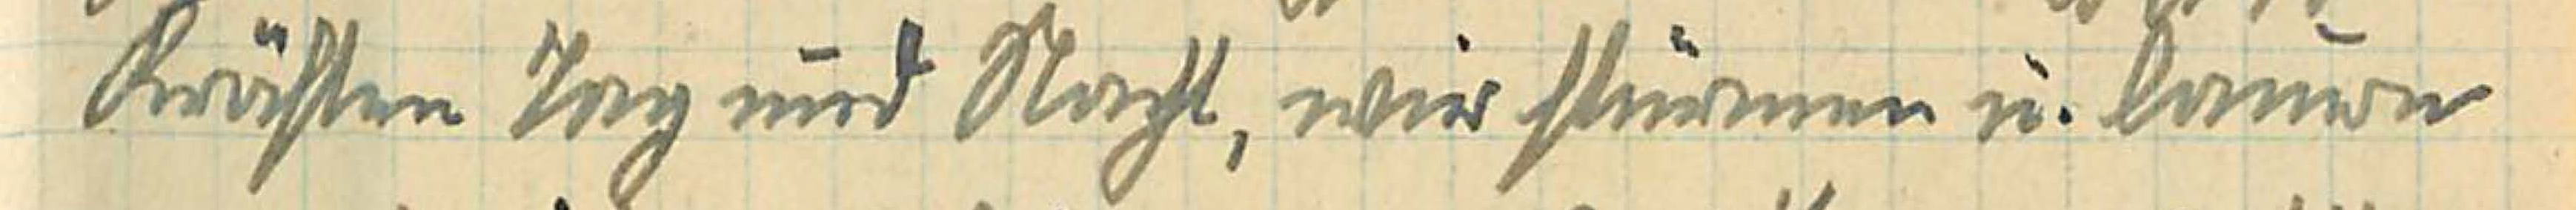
Kräften Tag und Nacht, wir stürmen u. lauern
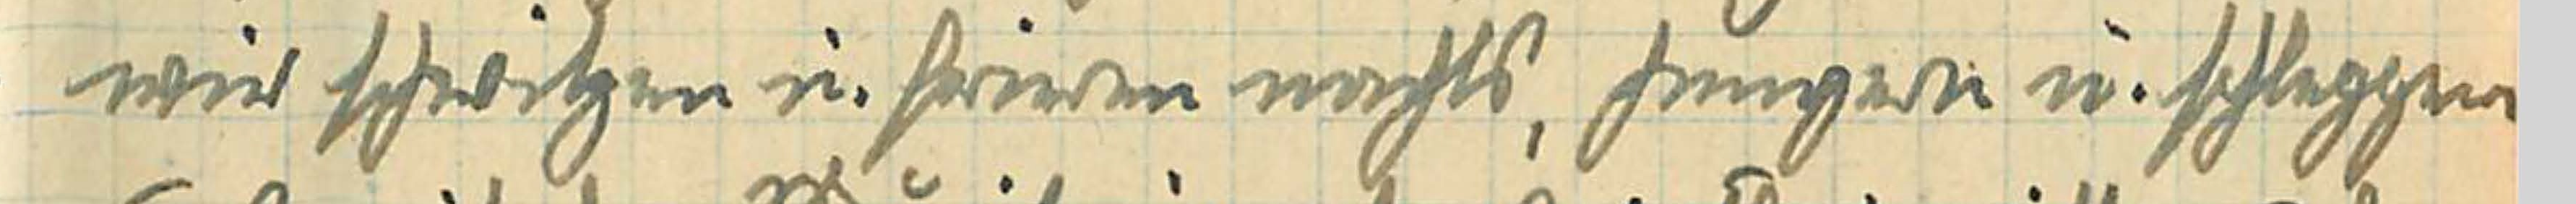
wir schwitzen u. frieren nachts, hungern u. schleppen
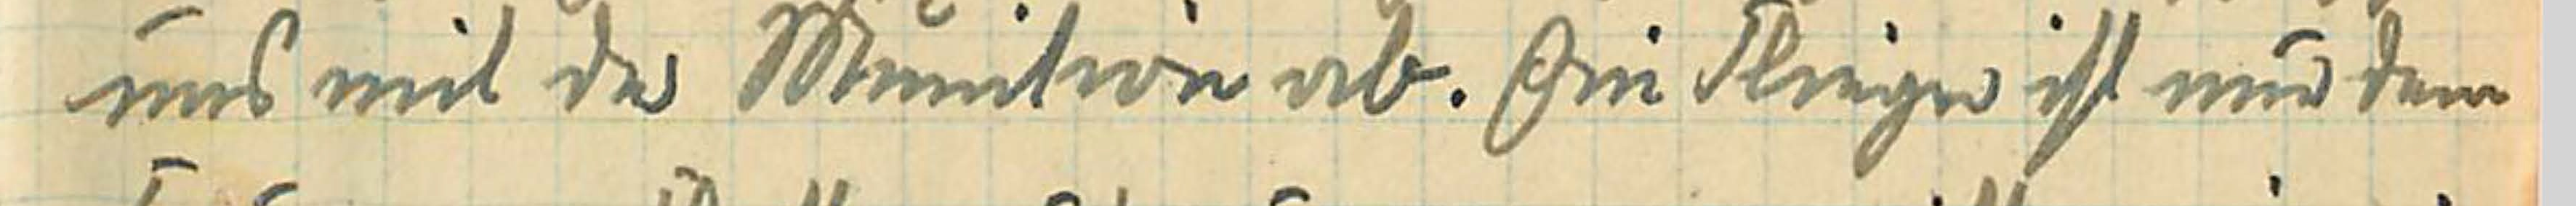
uns mit der Munition ab. Ein Flieger ist nur dem
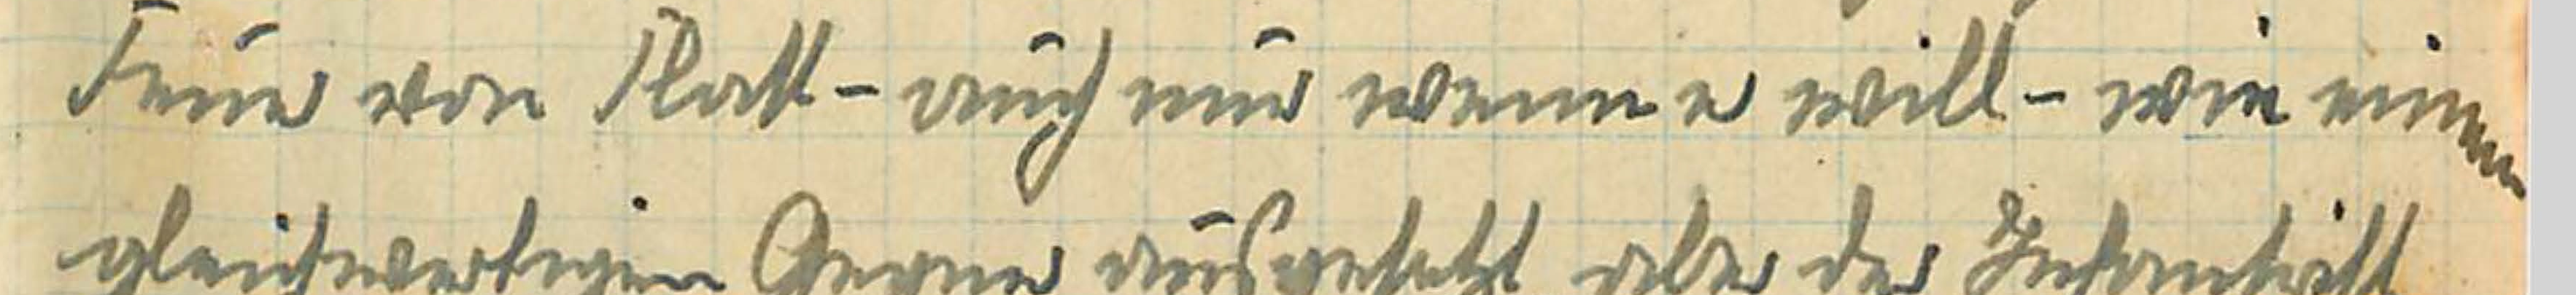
Feuer von Flak – auch nur wenn er will – wie einem
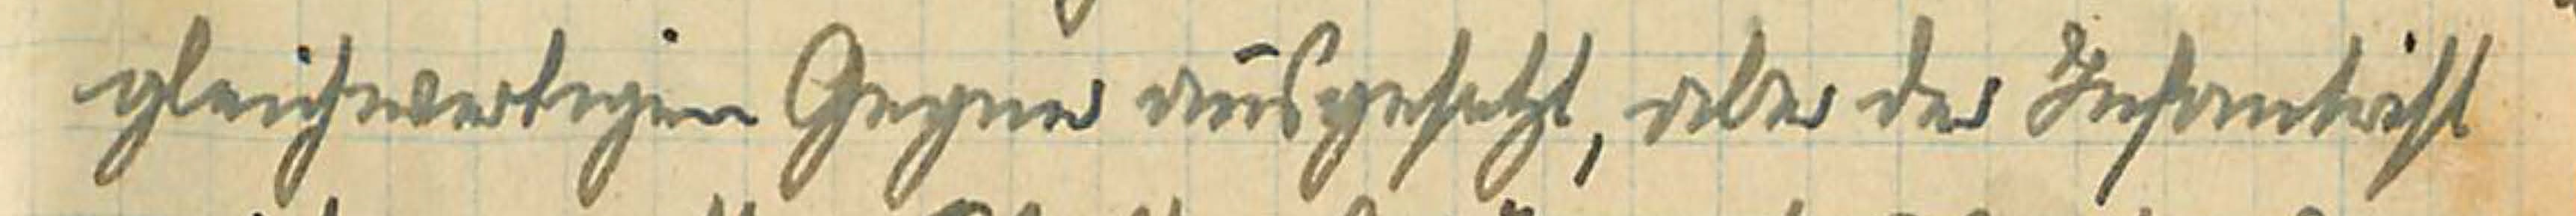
gleichwertigen Gegner ausgesetzt, aber der Infantrist
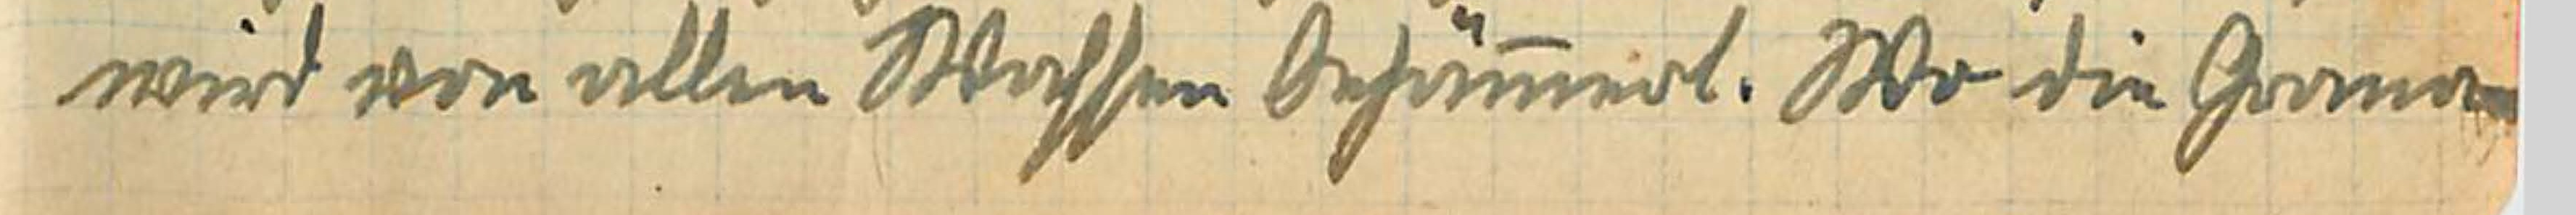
wird von allen Waffen behämmert. Wo die Grana-
